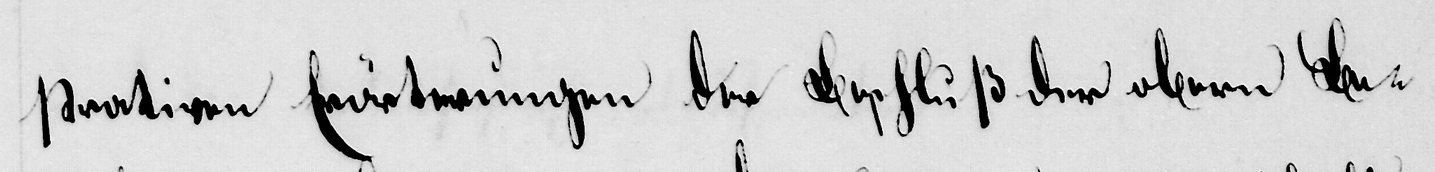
strativen Erörterungen der Beschluß der obern Be¬
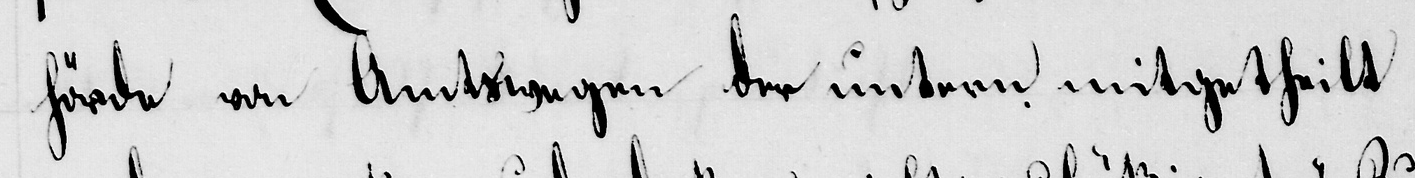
hörde von Amtswegen der untern mitgetheilt
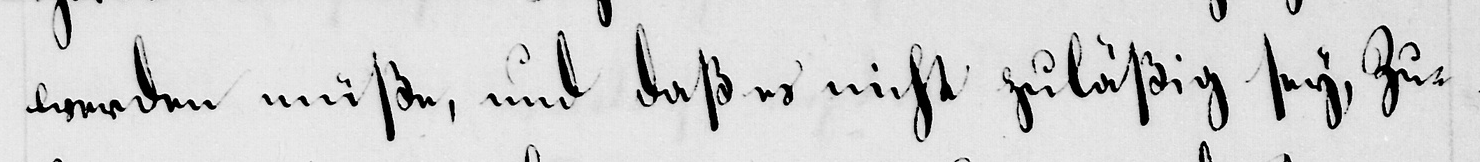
werden müße, und daß es nicht zuläßig sey, Zu¬
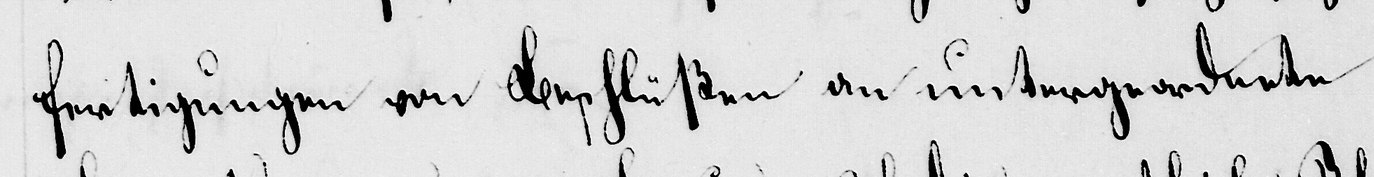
fertigungen von Beschlüßen an untergeordnete
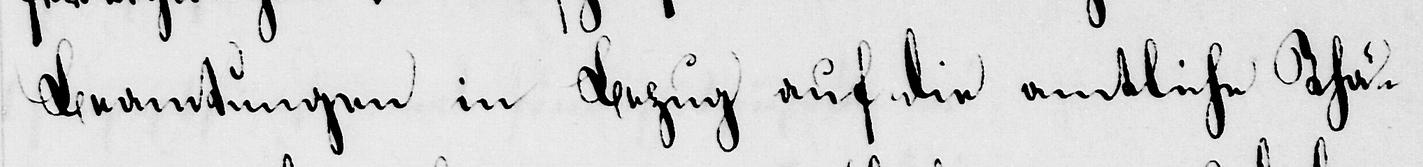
Beamtungen in Bezug auf die amtliche Thä¬
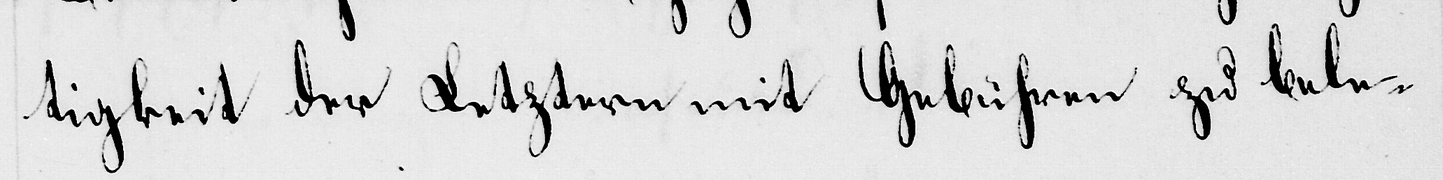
tigkeit der Letztern mit Gebühren zu bele¬
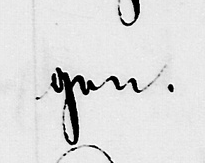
gen.
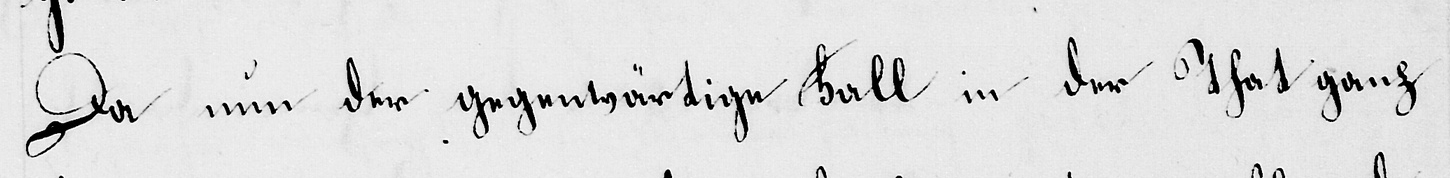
Da nun der gegenwärtige Fall in der That ganz
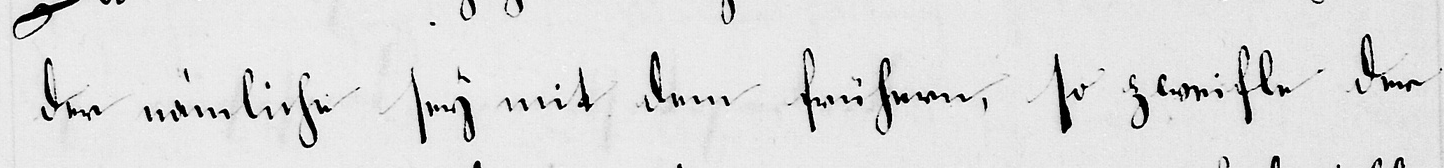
der nämliche sey mit dem frühern, so zweifle der
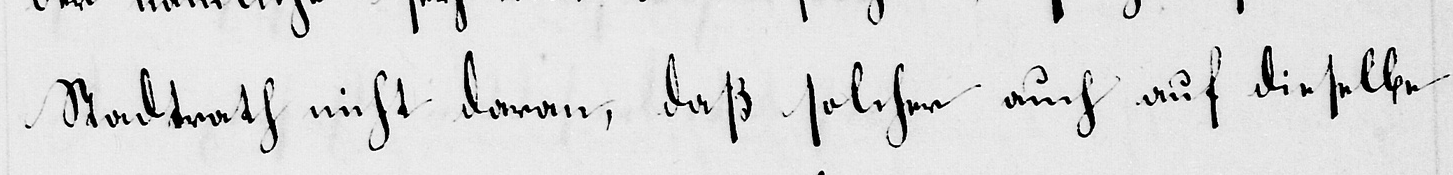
Stadtrath nicht daran, daß solcher auch auf dieselbe
